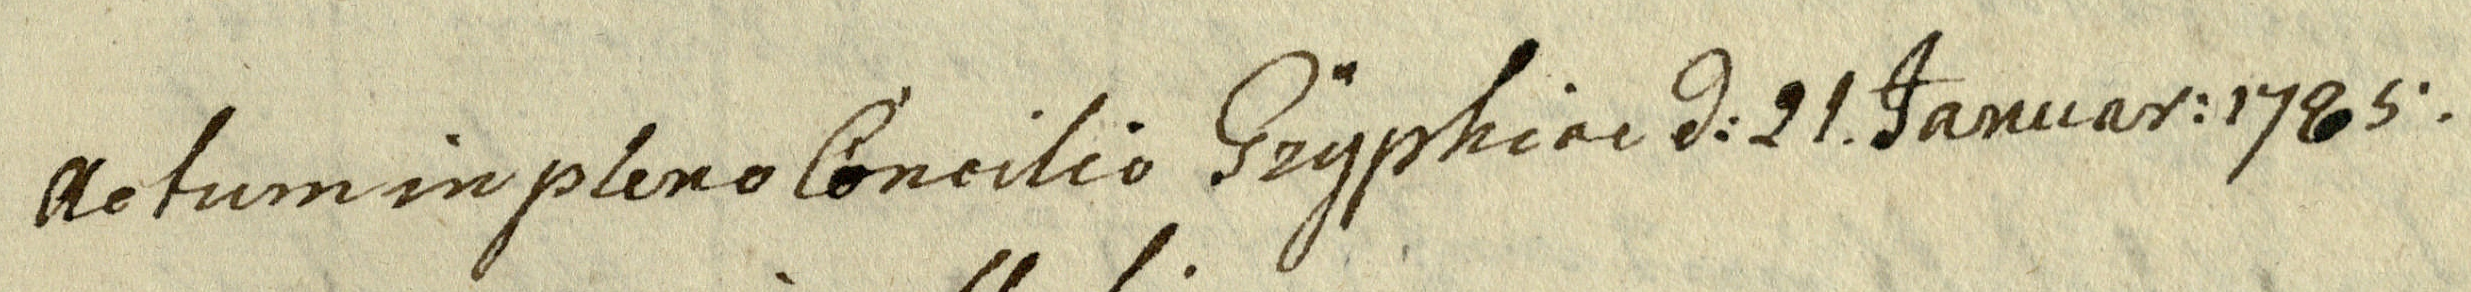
Actum in pleno Concilio Grÿphiae d. 21. Januar: 1785.
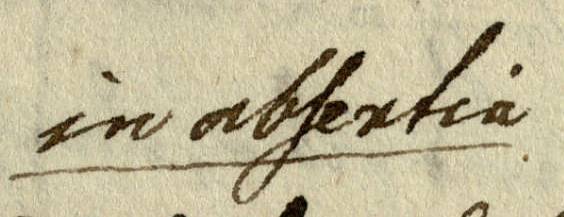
in absentia
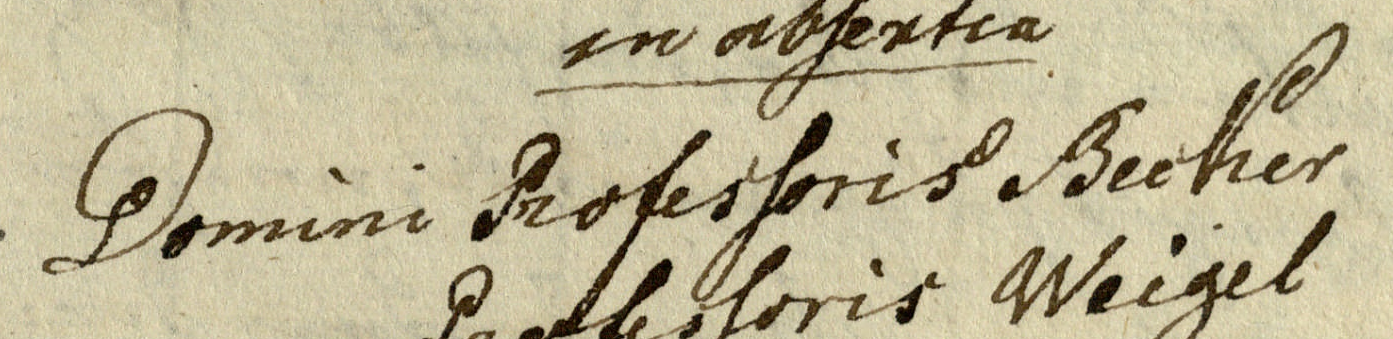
Domini Professoris Becker
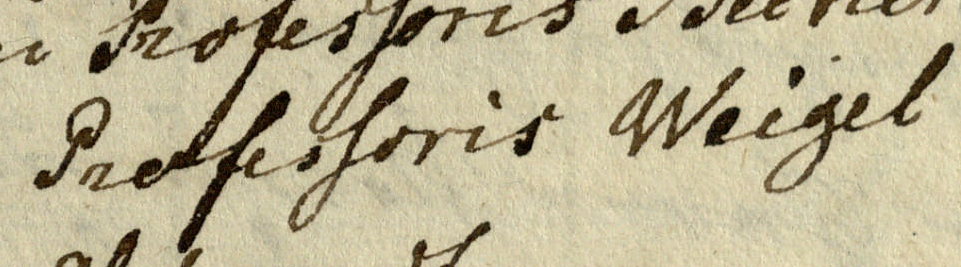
Professoris Weigel
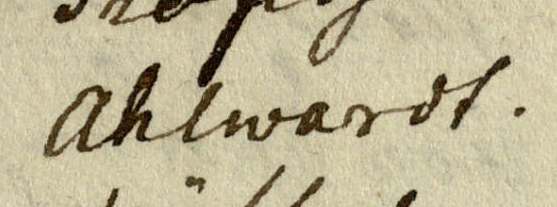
Ahlwardt.
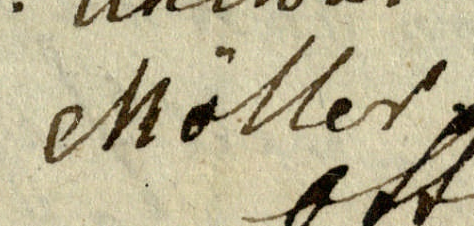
Möller.
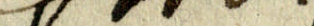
Otto.
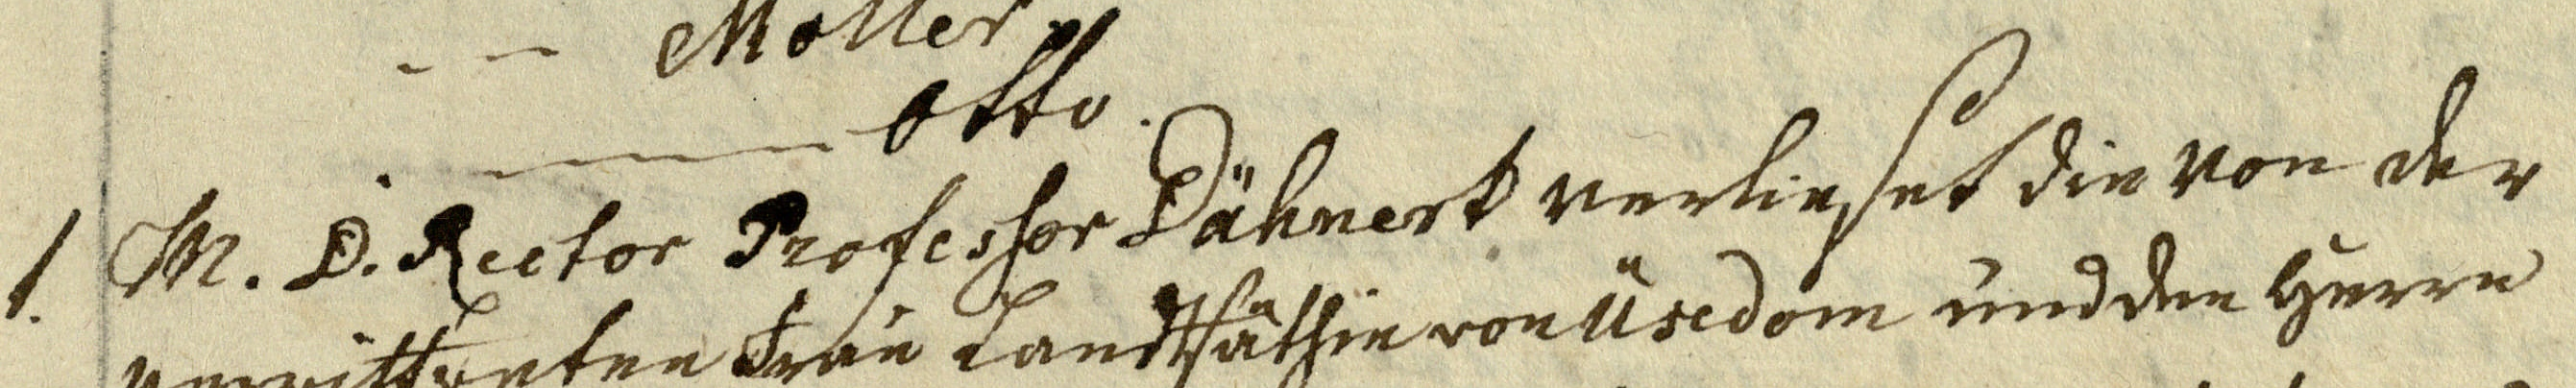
1. M. D. Rector Professor Dähnert verlieset die von der
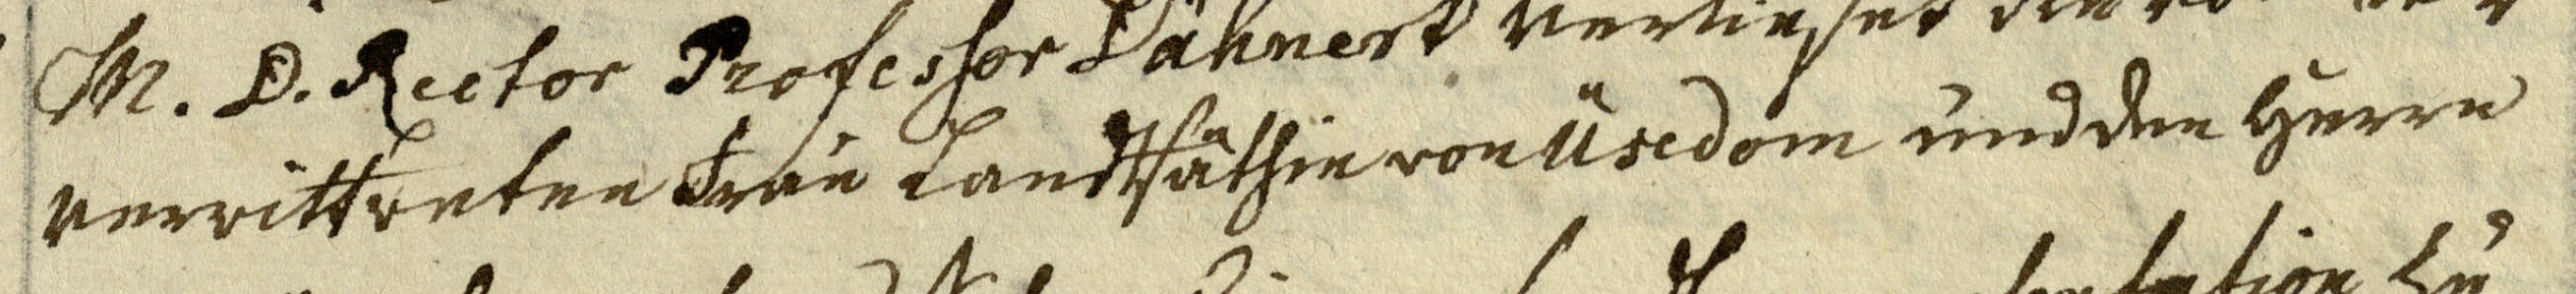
verwittweten Frau LandRäthin von Üsedom und den Herrn
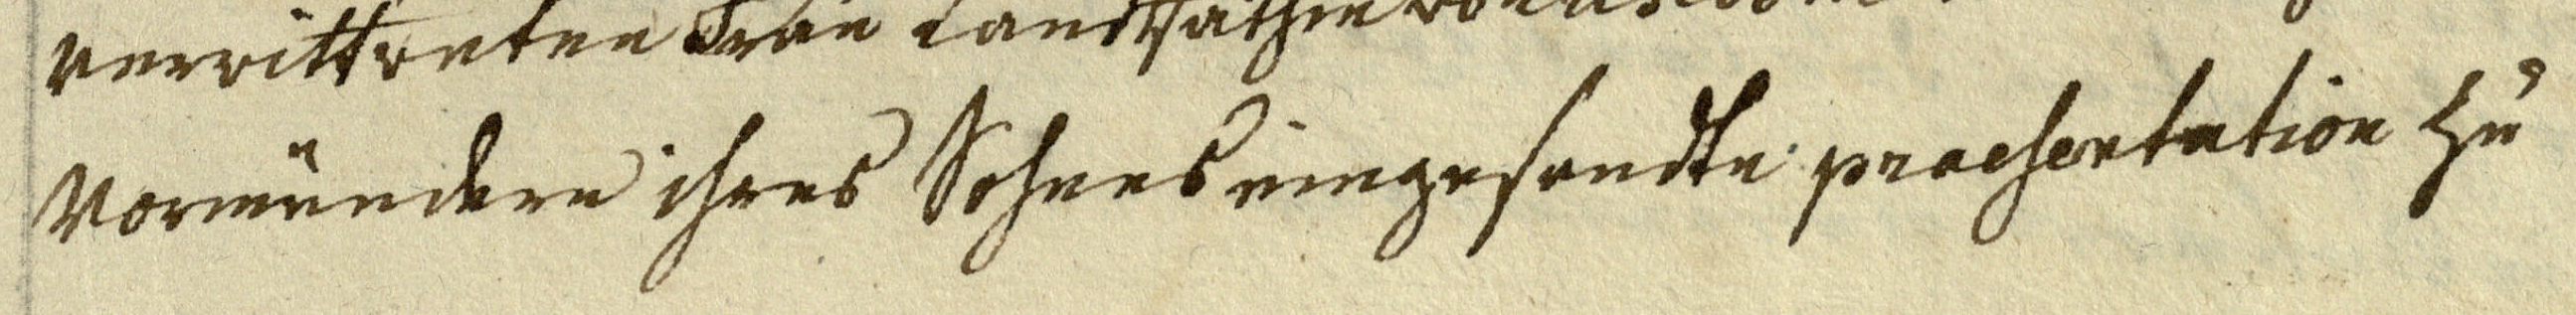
Vormündern ihres Sohnes eingesandte praesentation zu
